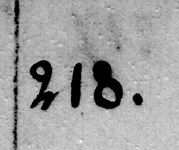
2032.
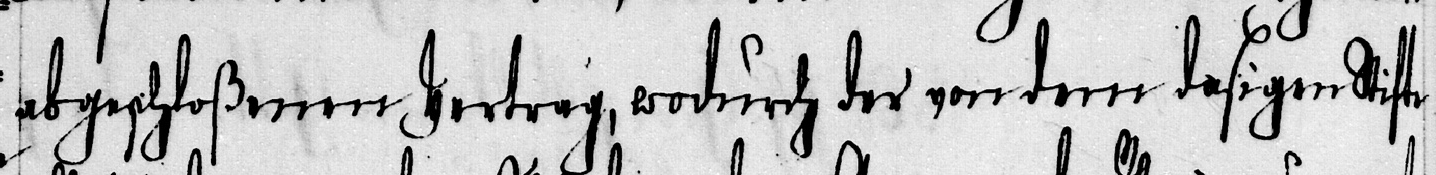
abgeschloßenen Vertrag, wodurch der von dem dasigen Stif¬
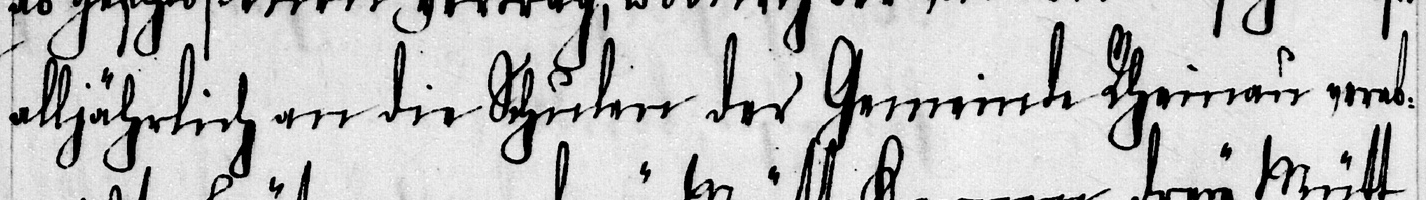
lljährlich an die Schulen der Gemeinde Rheinau vera¬
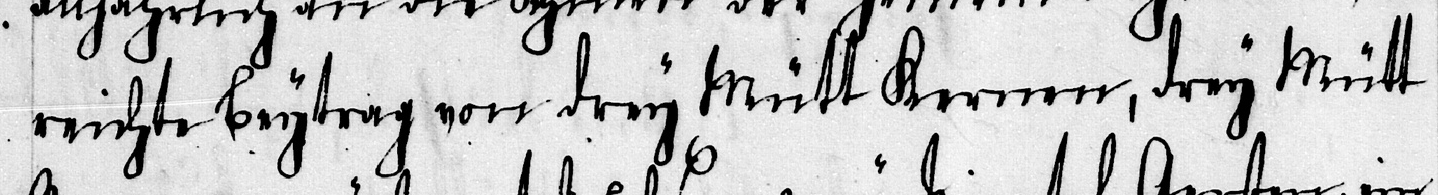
breichte Beytrag von drey Mütt Kernen, drey Mütt
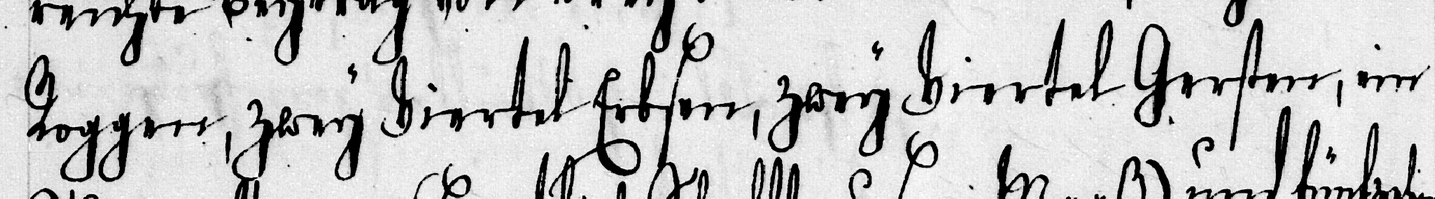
Roggen, zwey Viertel Erbsen, zwey Viertel Gersten, ein
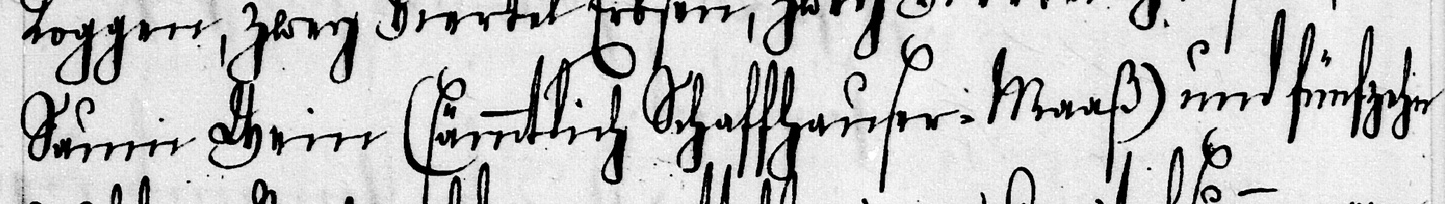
Saum Wein (sämmtlich Schaffhauser-Maaß) und fünfzehn
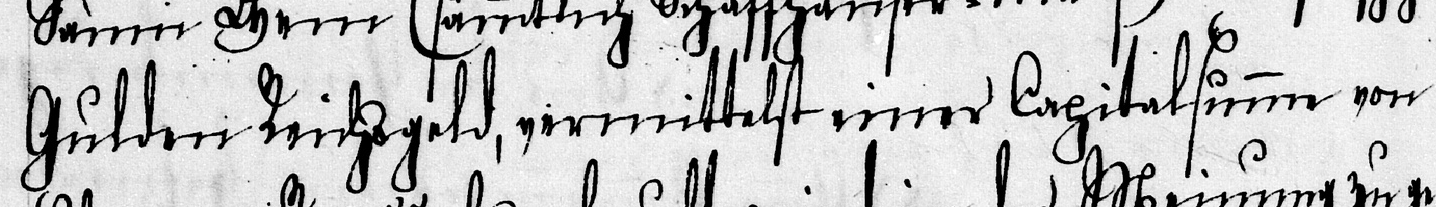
Gulden Reichsgeld, vermittelst einer Capitalsumme von
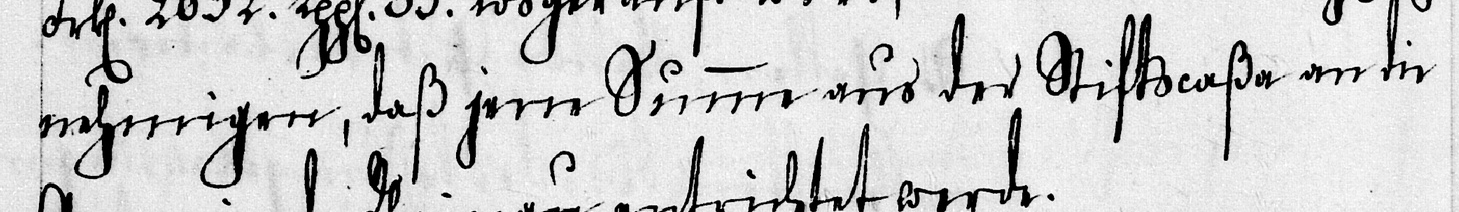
enehmigen, daß jene Summe aus der Stiftscaßa an die
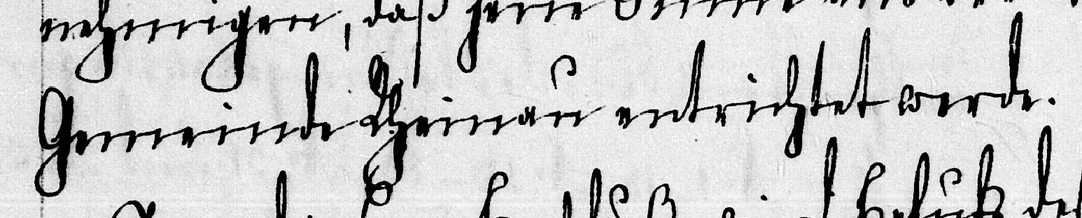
Gemeinde Rheinau entrichtet werde.
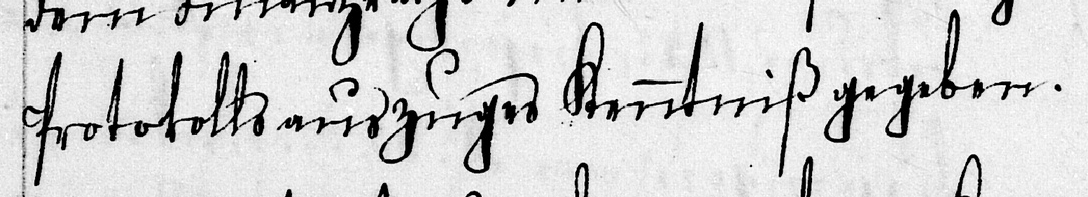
Protokollsauszuges Kenntniß gegeben.
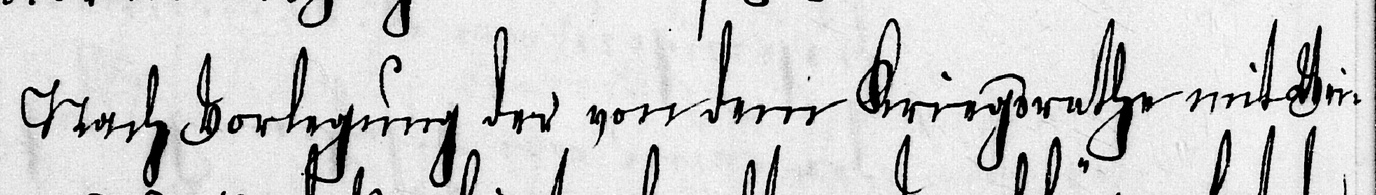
Nach Vorlegung der von dem Kriegsrathe mit Wei¬
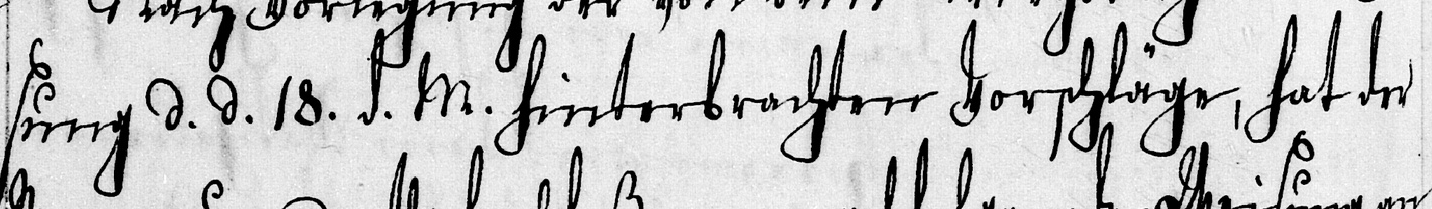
sung d. d. 18. d. M. hinterbrachten Vorschläge, hat der
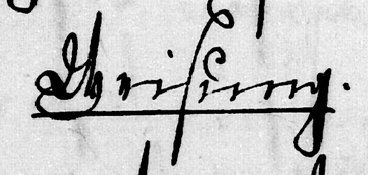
Weisung:
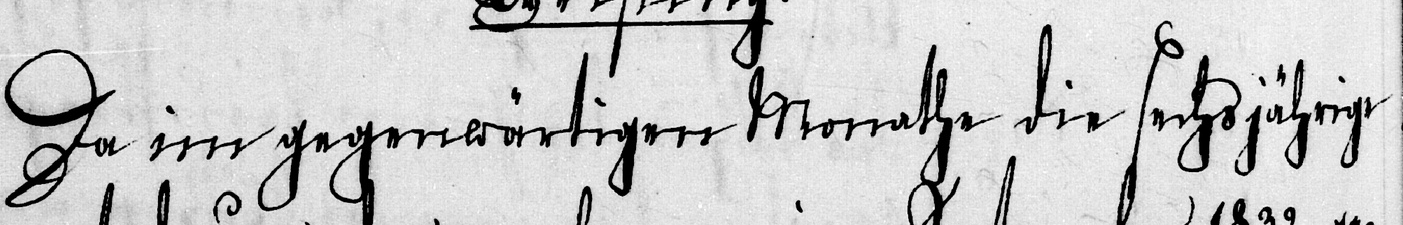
Da im gegenwärtigen Monathe die sechsjährige
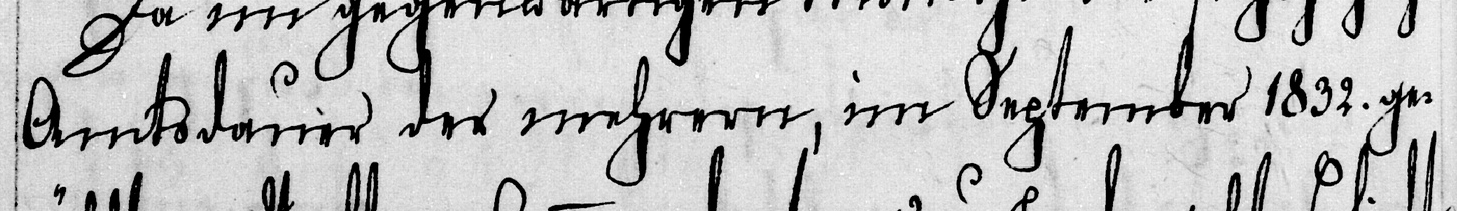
Amtsdauer der mehrern, im September 1832. ge¬
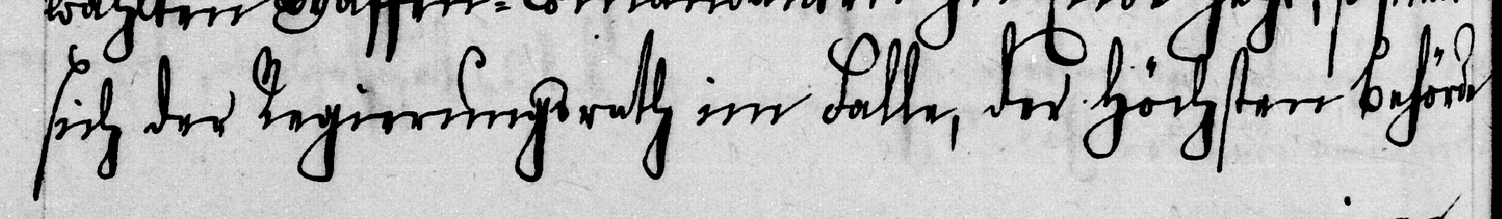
sich der Regierungsrath im Falle, der Höchsten Behörde
